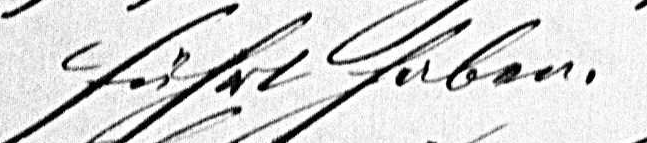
führt haben.
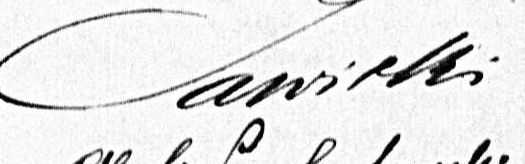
Sawicki
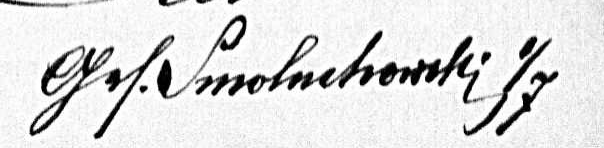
Ges. Smolnchowski 1/7
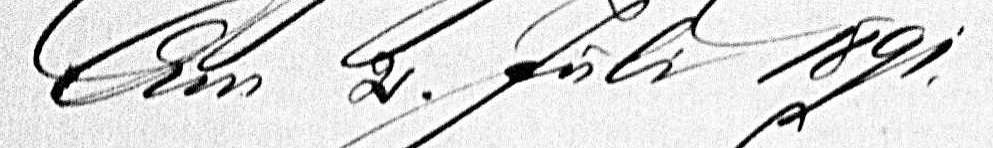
Am 2. Juli 1891
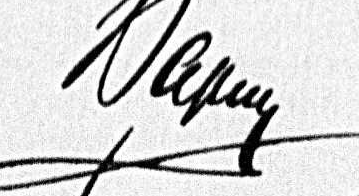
Braun
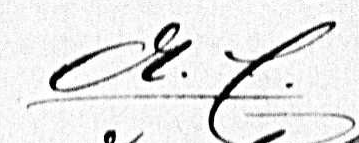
A. E.
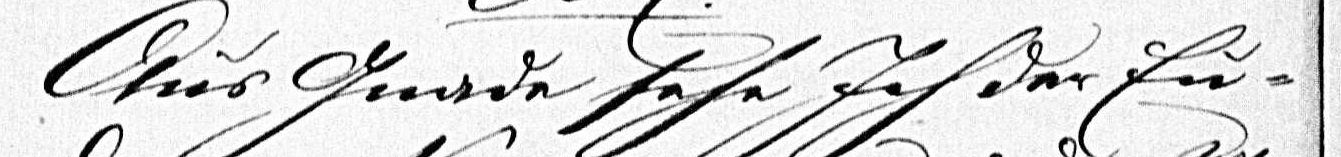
Aus Gnade sehe Ich der Eu¬
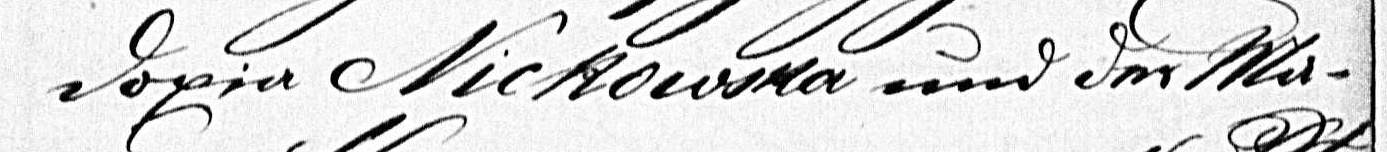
doxia Nickowska und der Ma¬
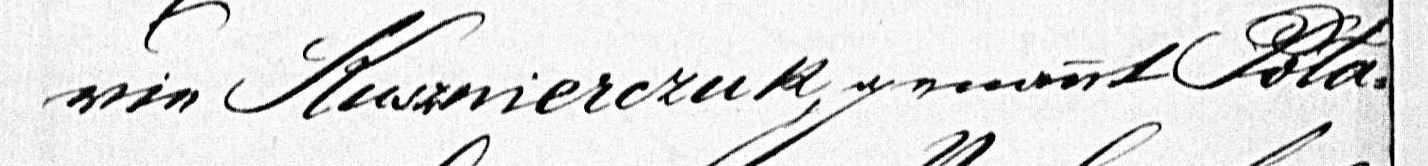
rie Kusznierczuk genannt Poła¬
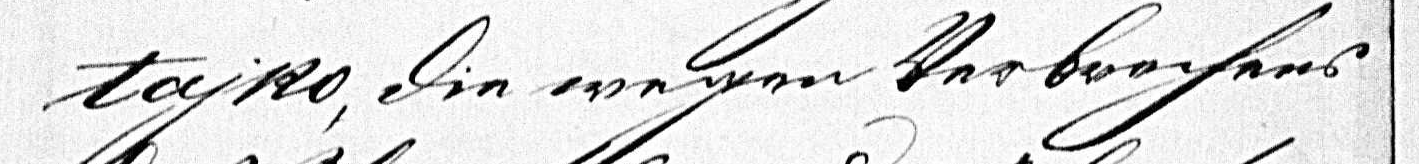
tajko, die wegen Verbrechens
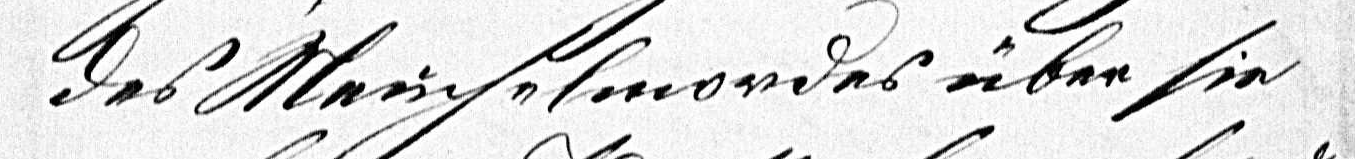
des Meuchelmordes über sie
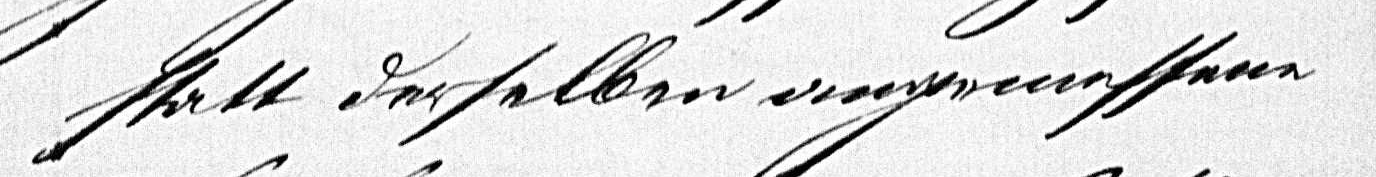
statt derselben angemessene
